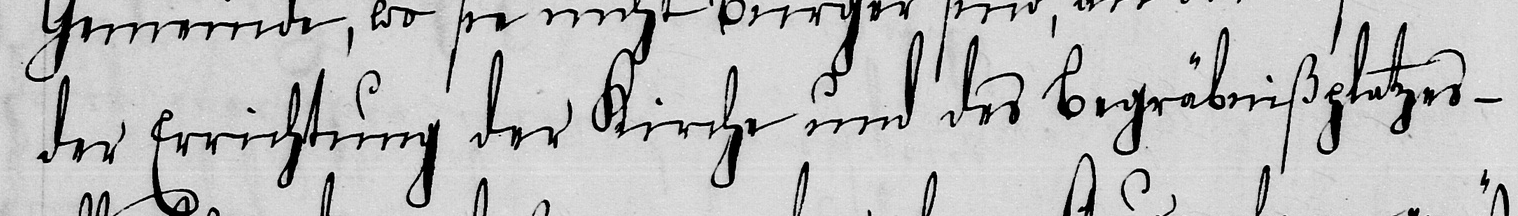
der Errichtung der Kirche und des Begräbnißplatzes
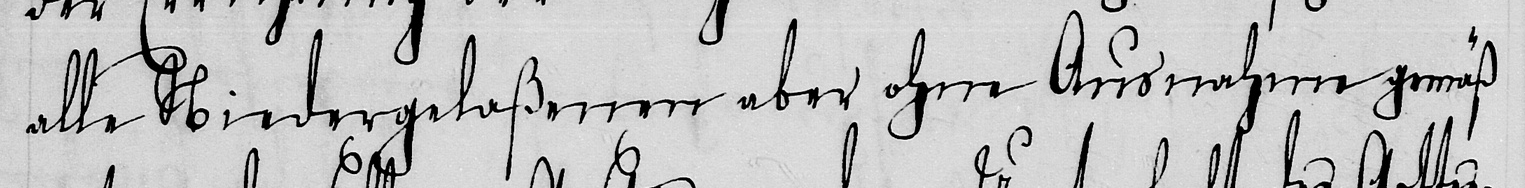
alle Niedergelaßenen aber ohne Ausnahme gemäß
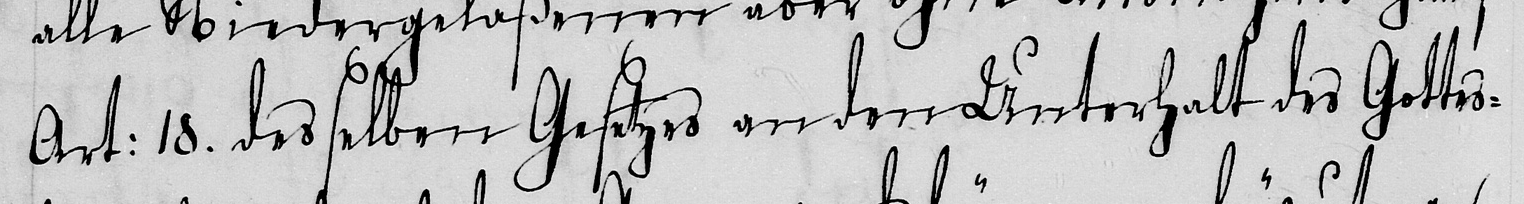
Art: 18. desselben Gesetzes an den Unterhalt des Gotte¬
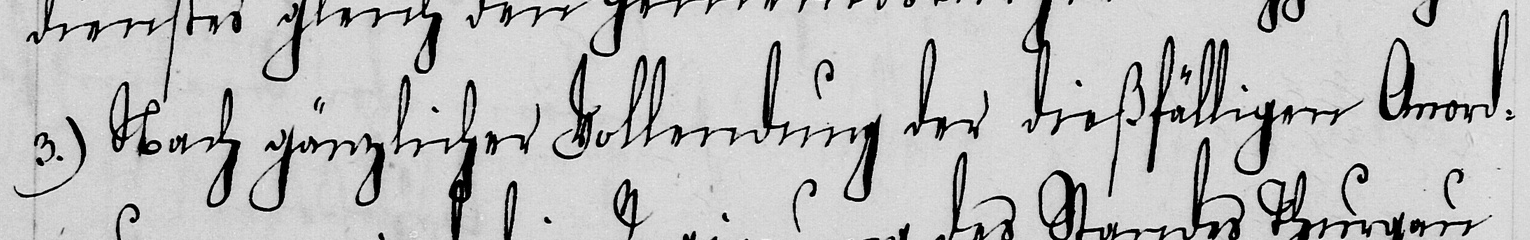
3.) Nach gänzlicher Vollendung der dießfälligen Anord¬
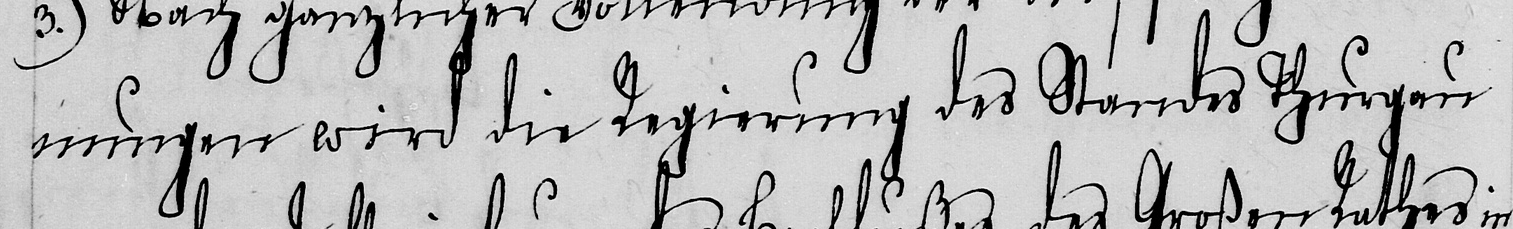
nungen wird die Regierung des Standes Thurgau
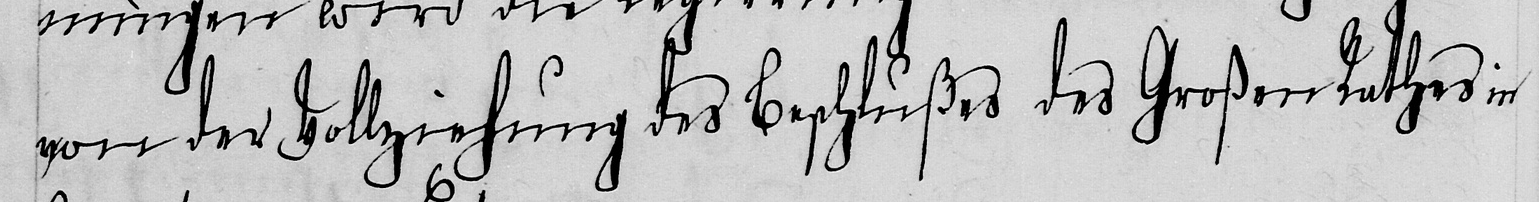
von der Vollziehung des Beschlußes des Großen Rathes in
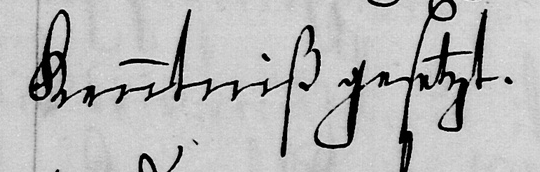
Kenntniß gesetzt.
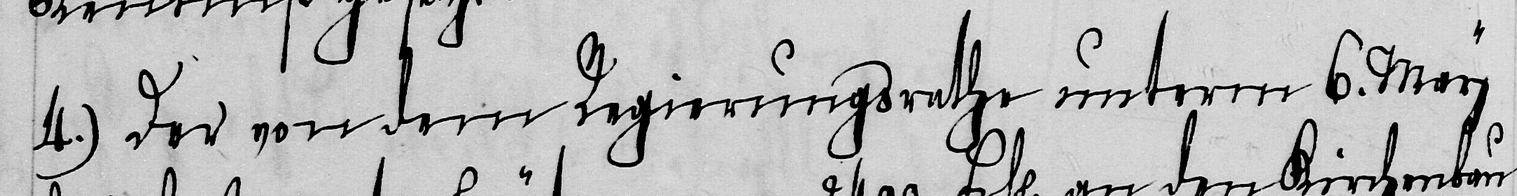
4.) Der von dem Regierungsrathe unterm 6, May
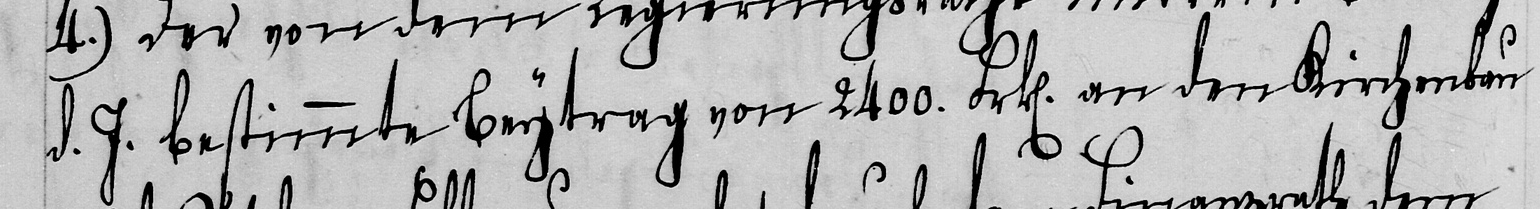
d. J. bestimmte Beytrag von 2400. Frk[en]. an den Kirchenbau
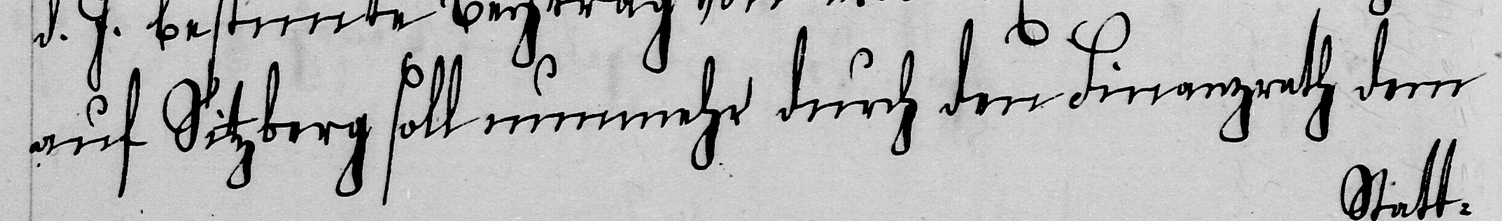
auf Sitzberg soll nunmehr durch den Finanzrath dem
